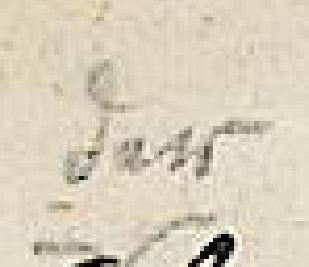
der
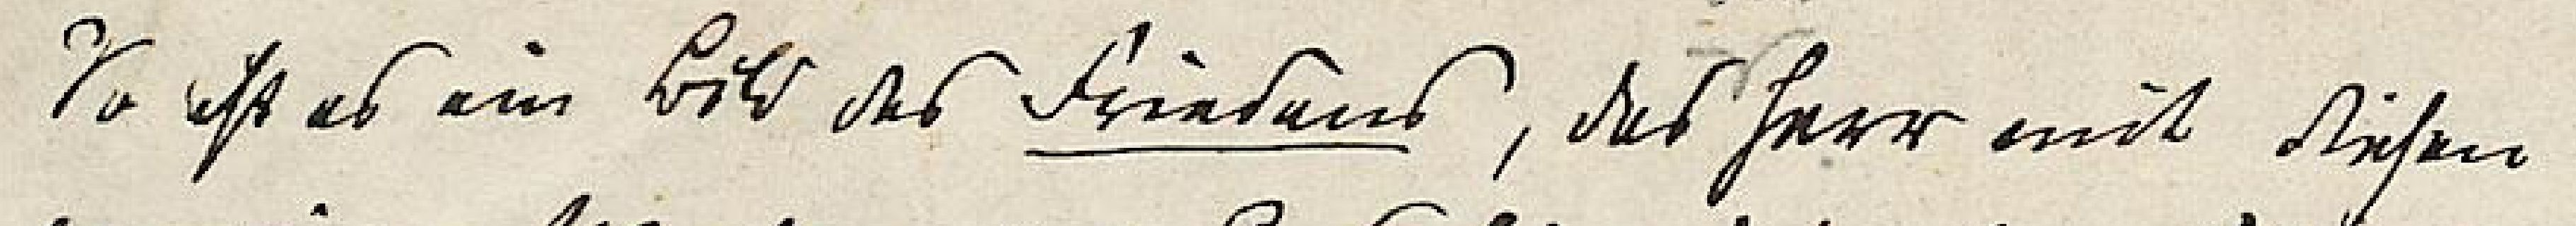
So ist es ein Bild des Friedens, das Herr mit diesen
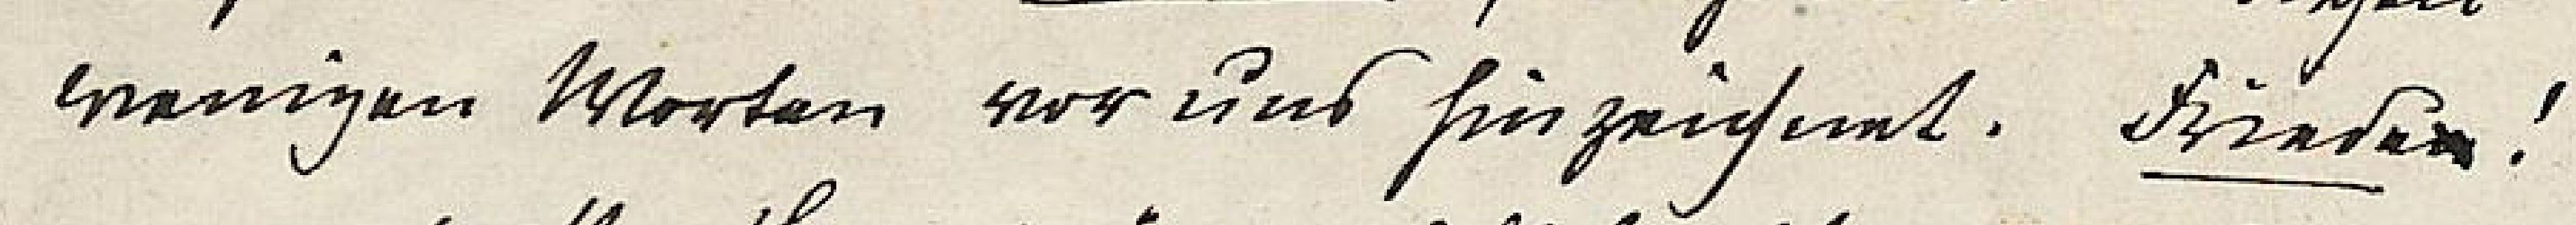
ewigen Worten vor uns hinzeichnet. Frieden!
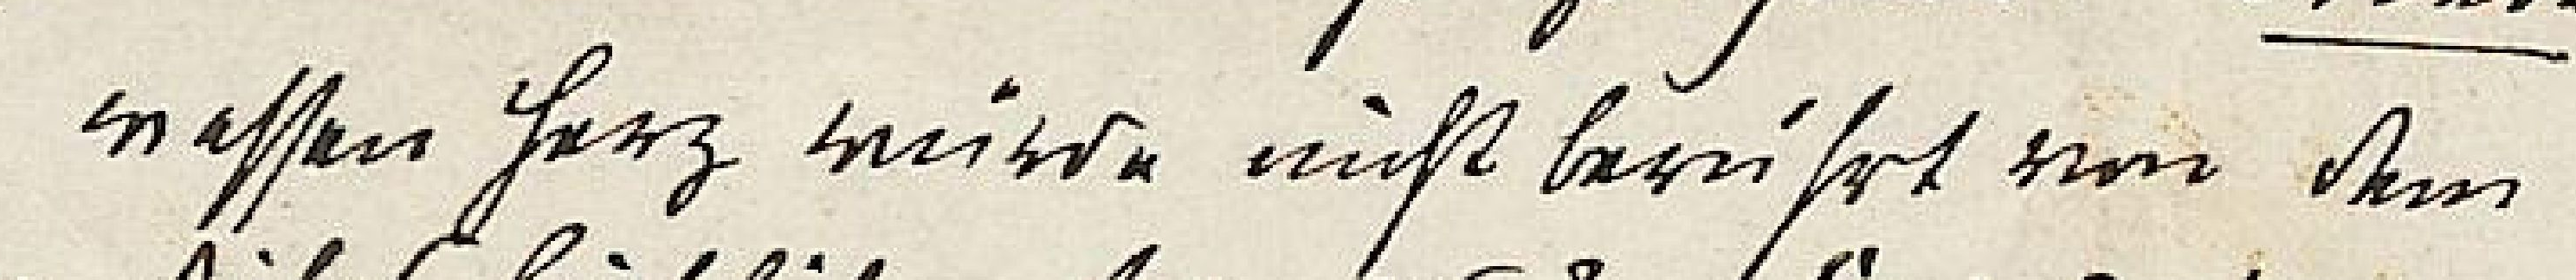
wessen Herz würde nicht berührt von dem
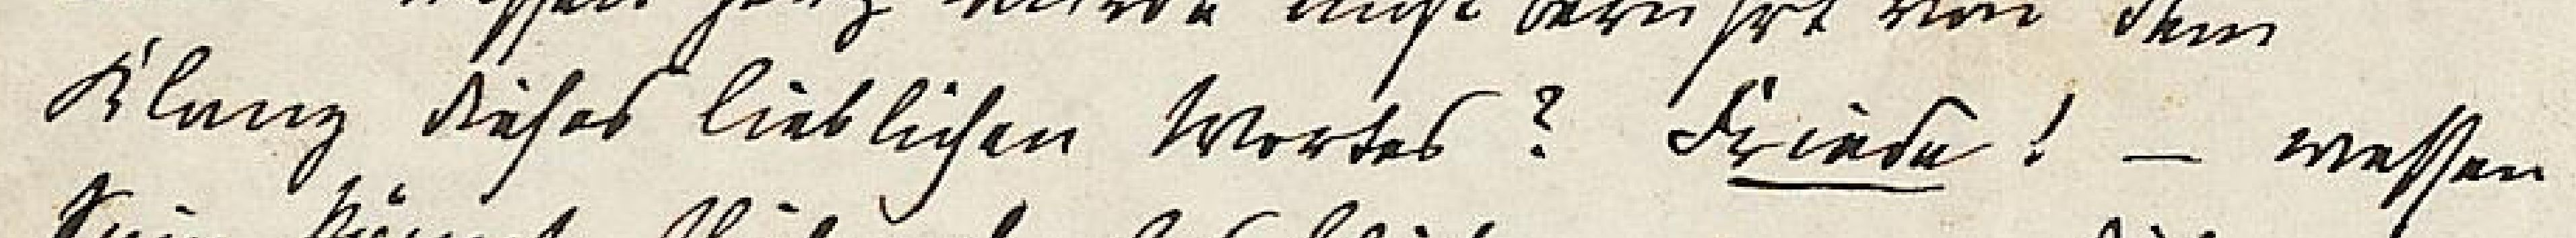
Klang dieses lieblichen Wortes? Friede! _ wessen
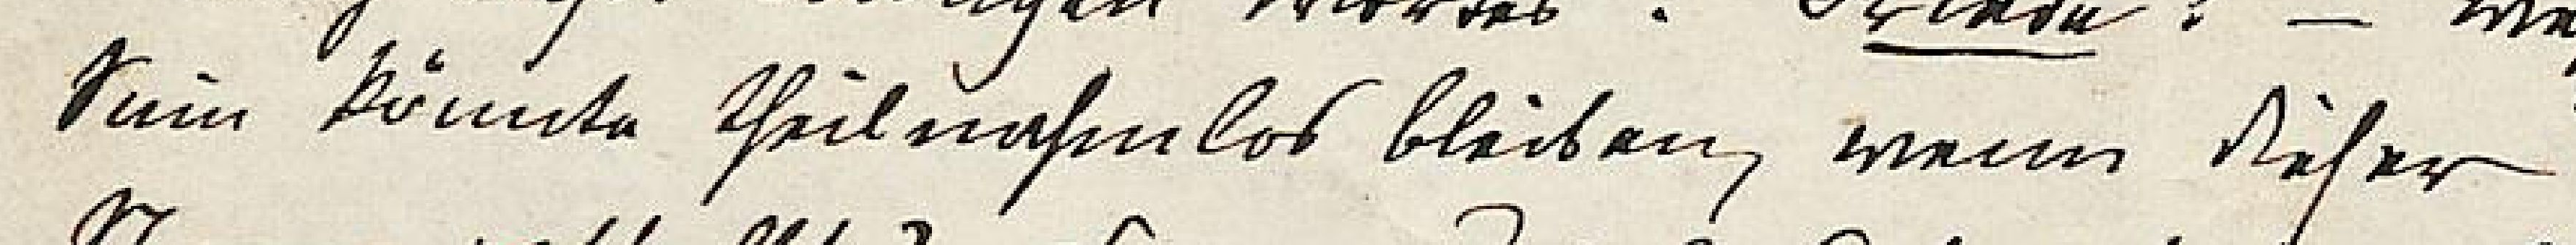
Sinn könnte theilnahmlos bleiben, wenn dieser
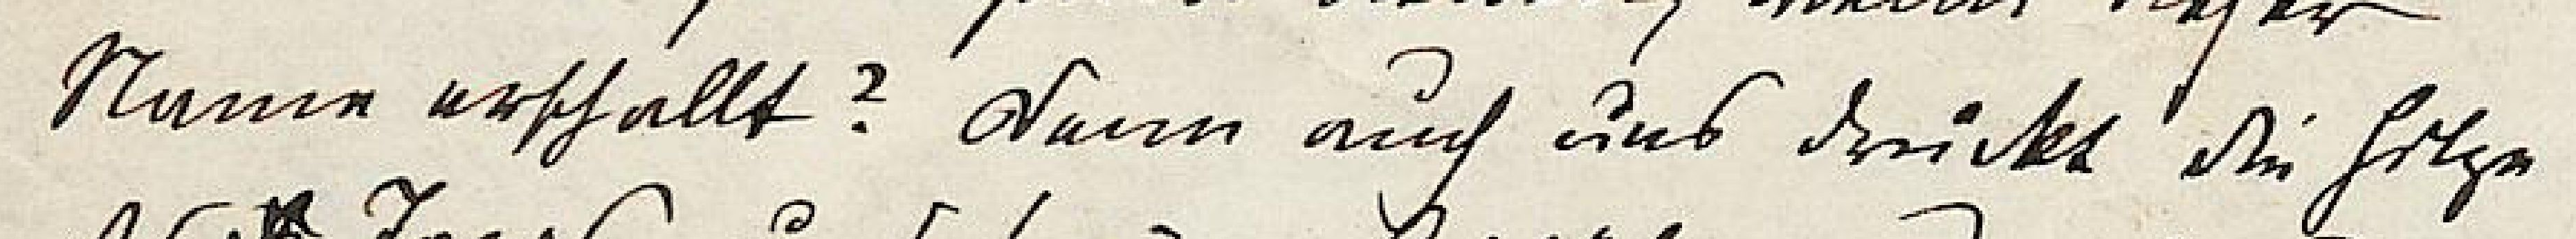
Name erschallt? Denn auch uns drückt die Hitze
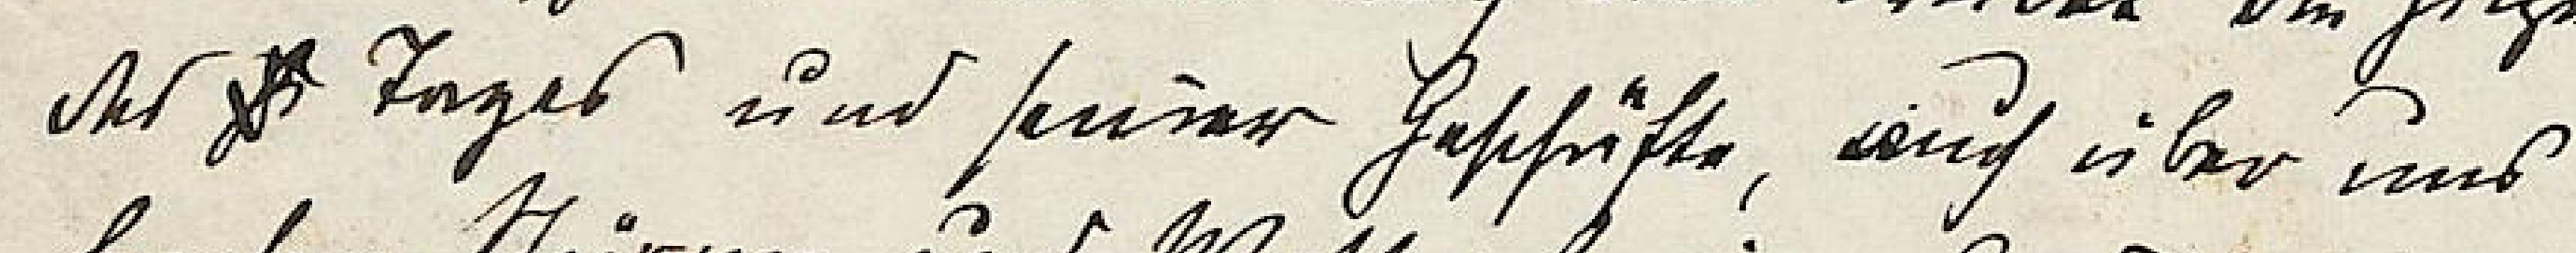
des h Tages und seiner Geschäft, auch über uns
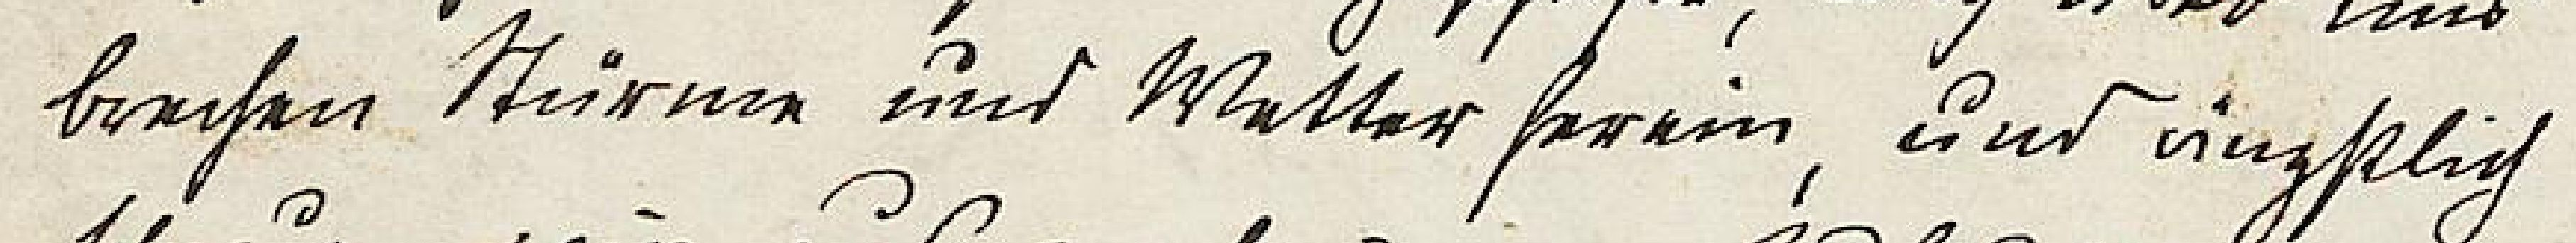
brechen Stürme und Wetter herein, und ängstlich
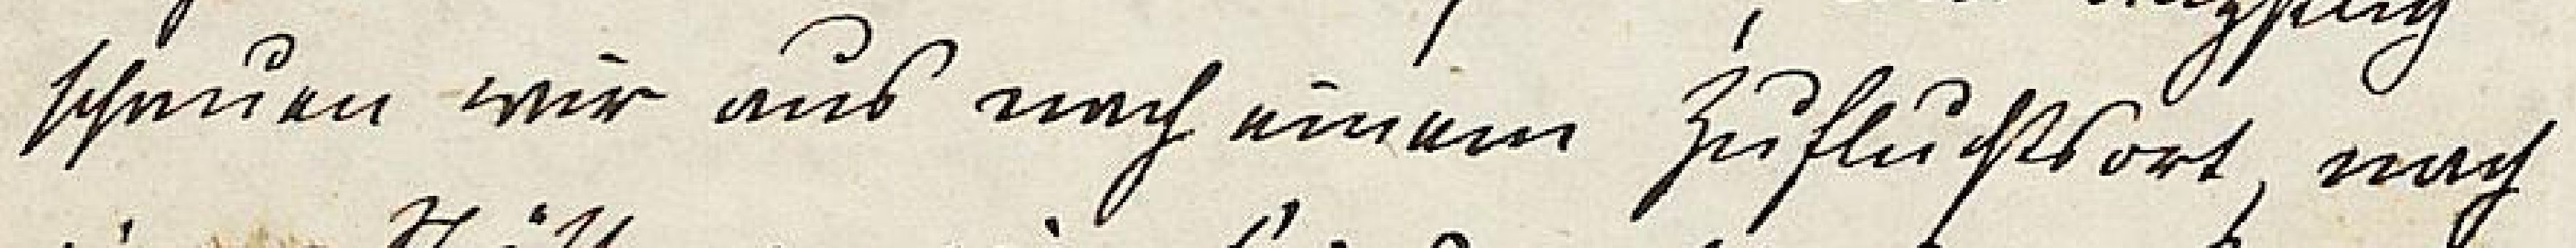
schauen wir aus nach einem Zufluchtsort, nach
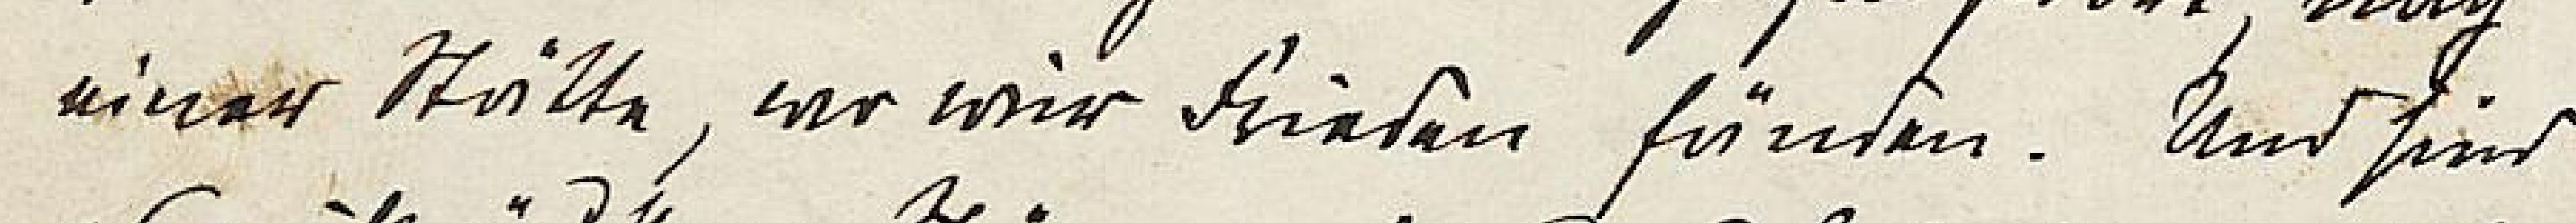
einer Stätte, wo wir Frieden fänden. Und sind
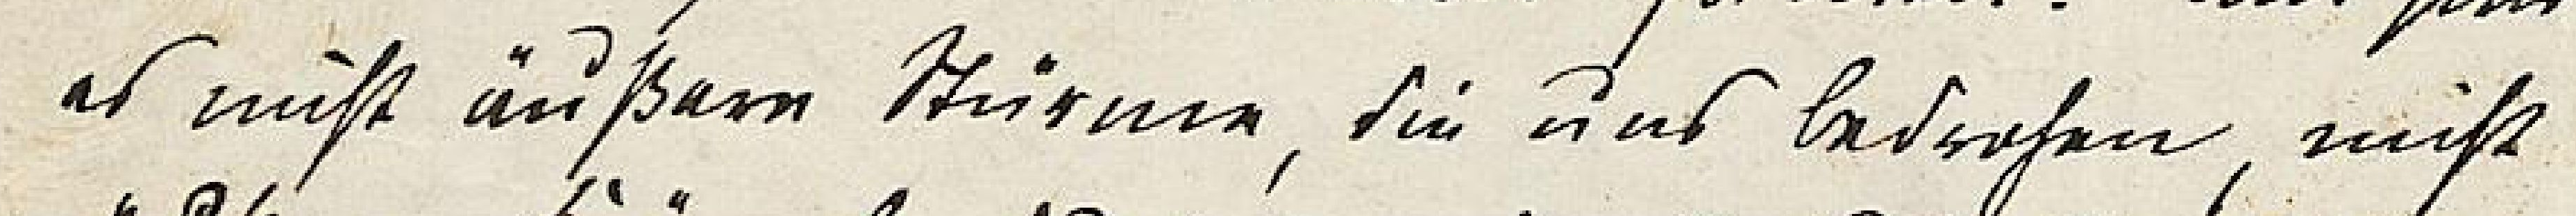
es nicht äußere Stürme, die uns bedrohen, nicht
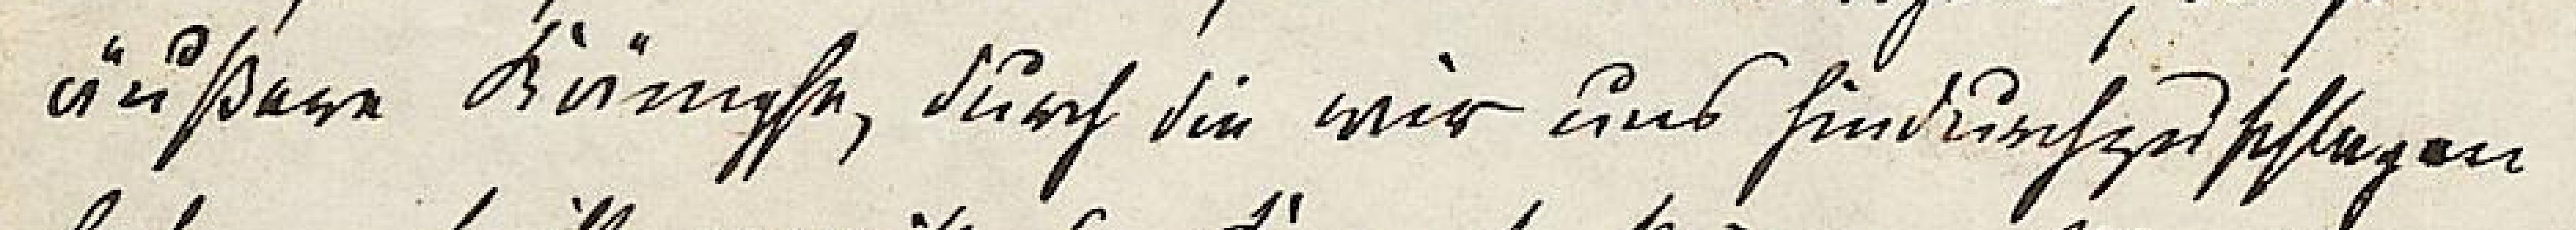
äußere Kämpfe, durch die wir uns hindurchzuschlagen
